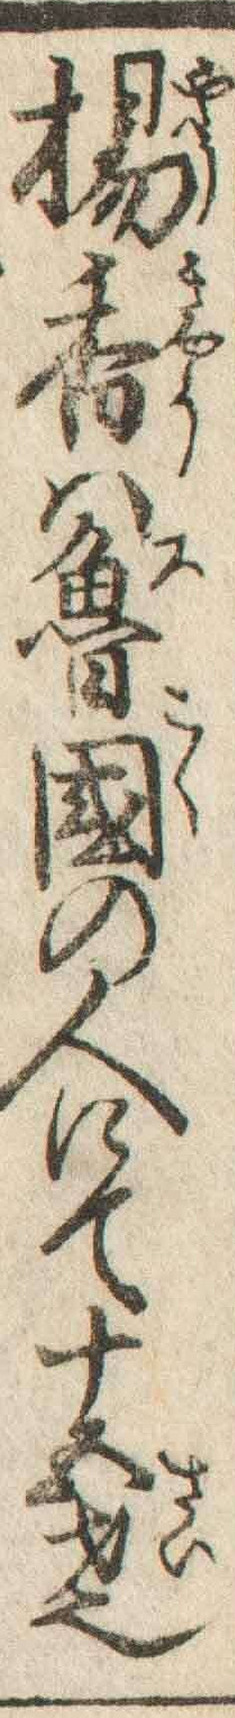楊香は魯国の人にて十五才也
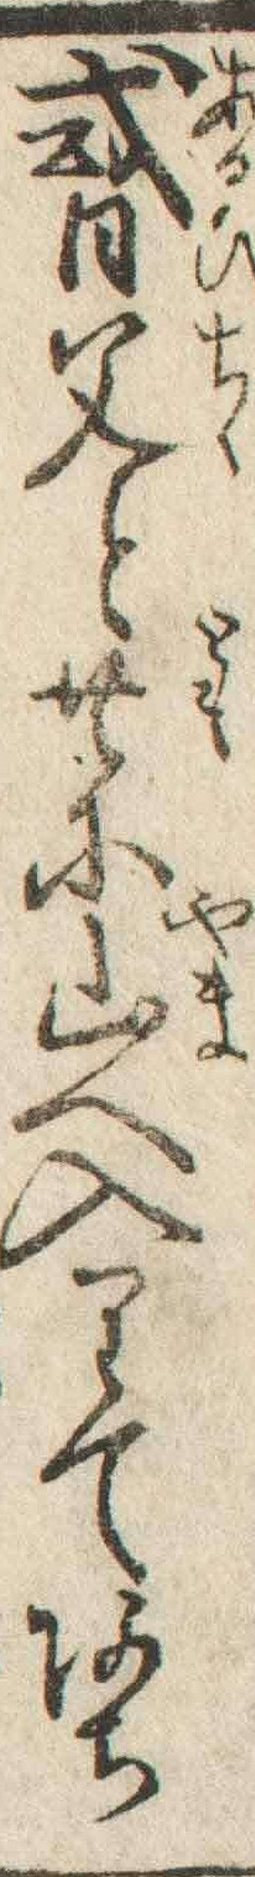或日父と共に山へ入りてあち
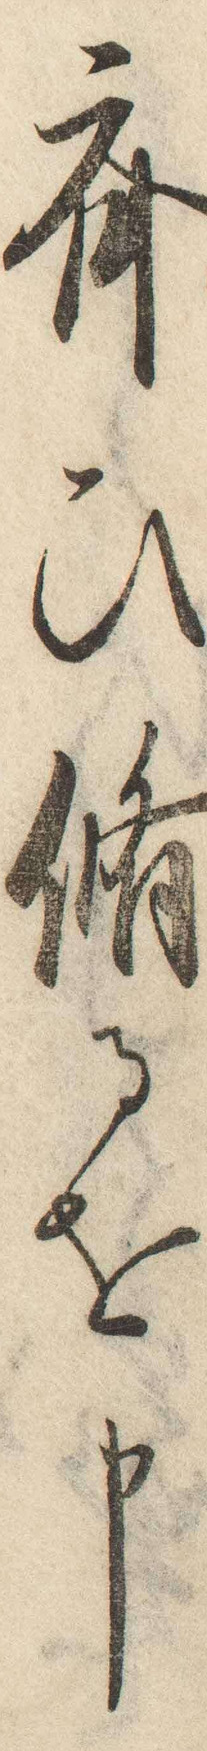斉ひ脩るを申
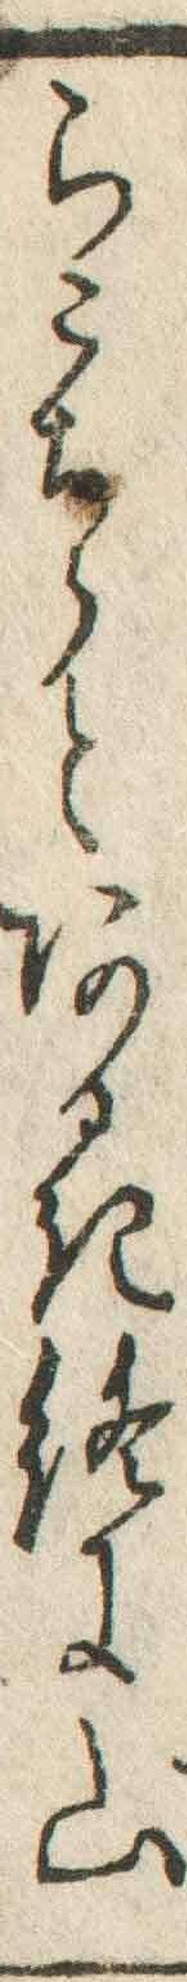らこちらとあるき終に山
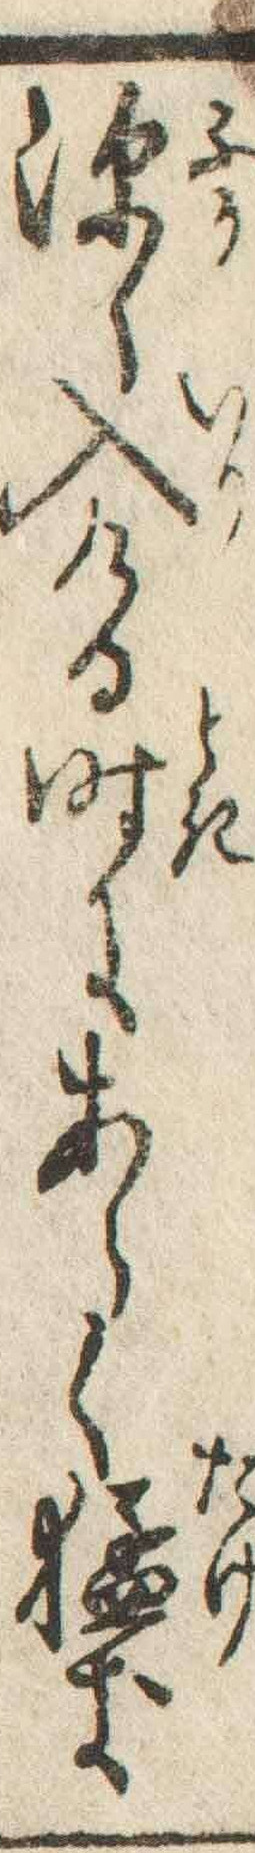深く入ける時にあらく猛き
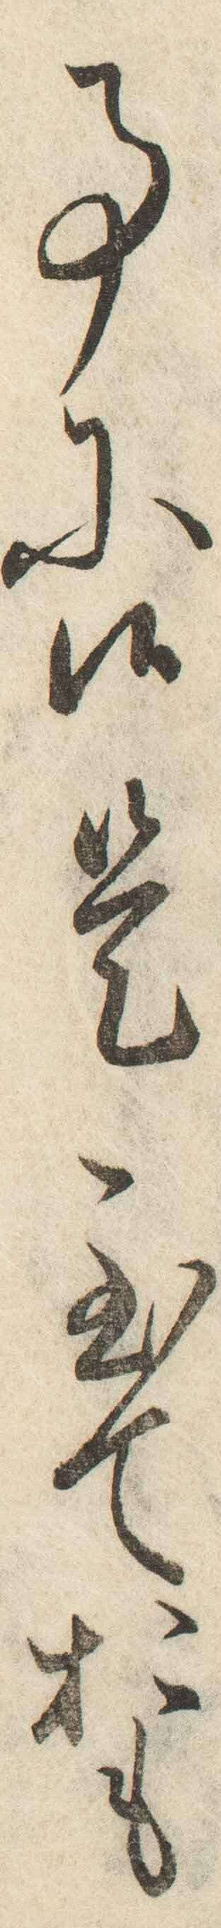事に候是至ておも
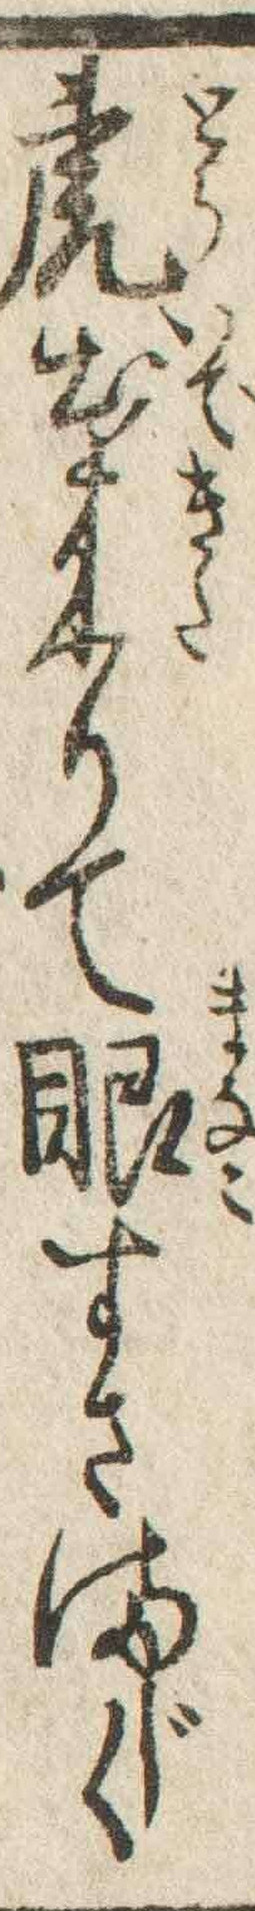虎出来りて眼すさまじく
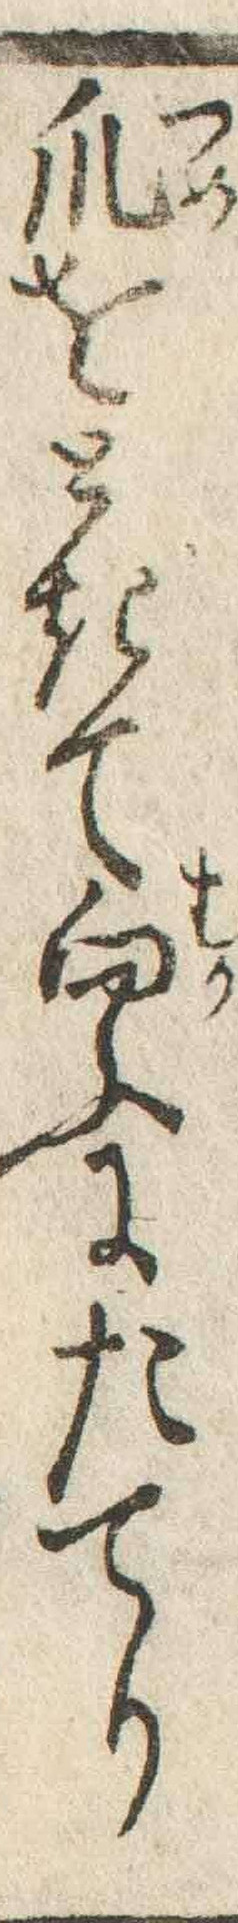爪をときて向ふにたてり
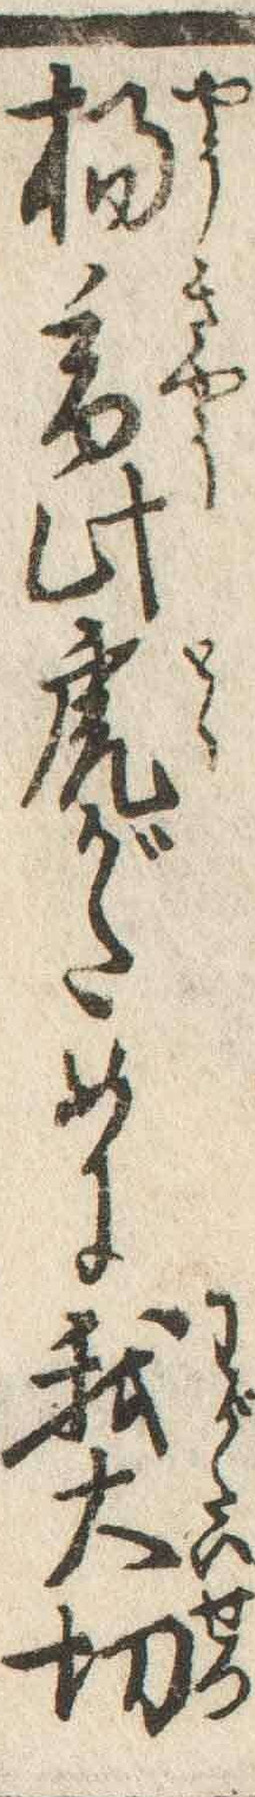楊香此虎がために我大切
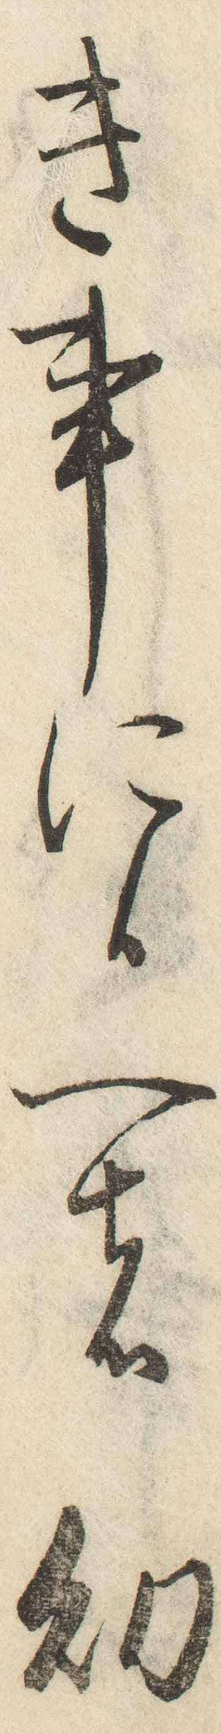き事に候へは幼
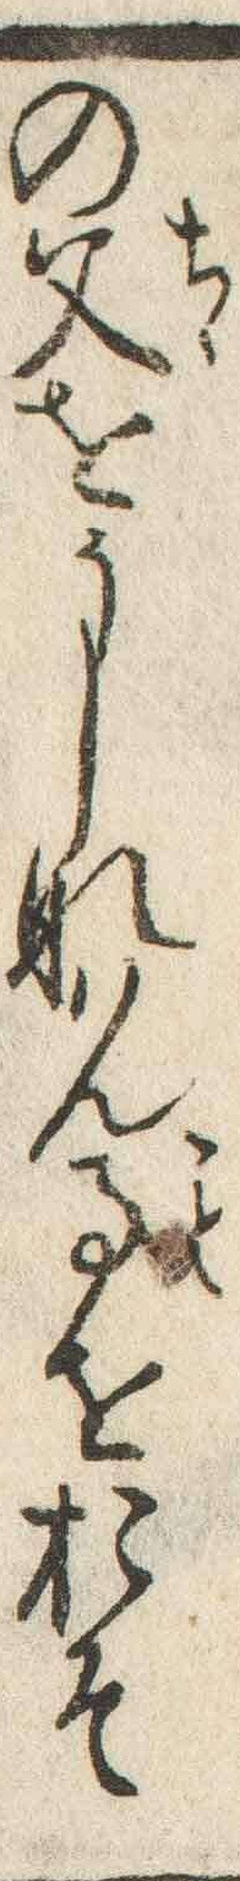の父をうしなはん事をおそ
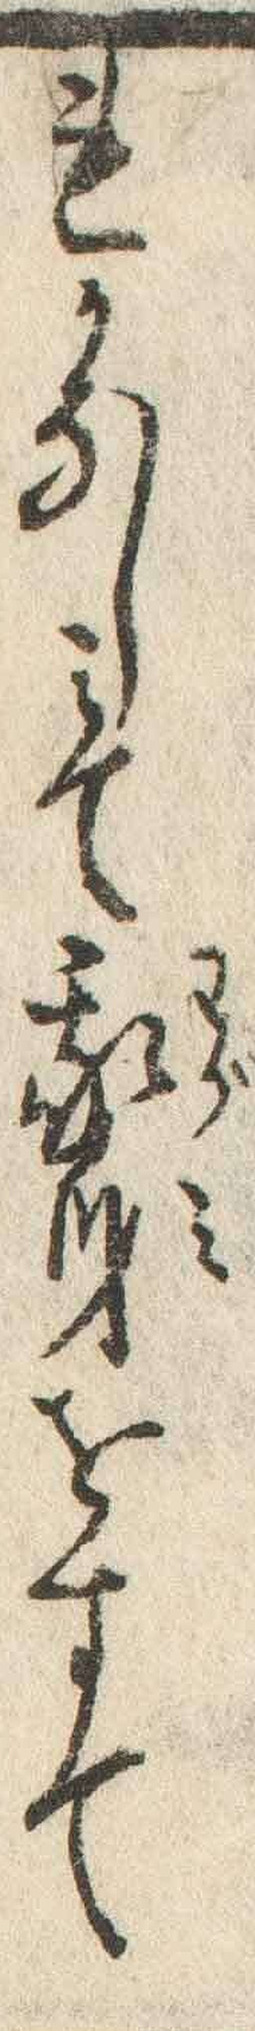れかなしみて我身をすて
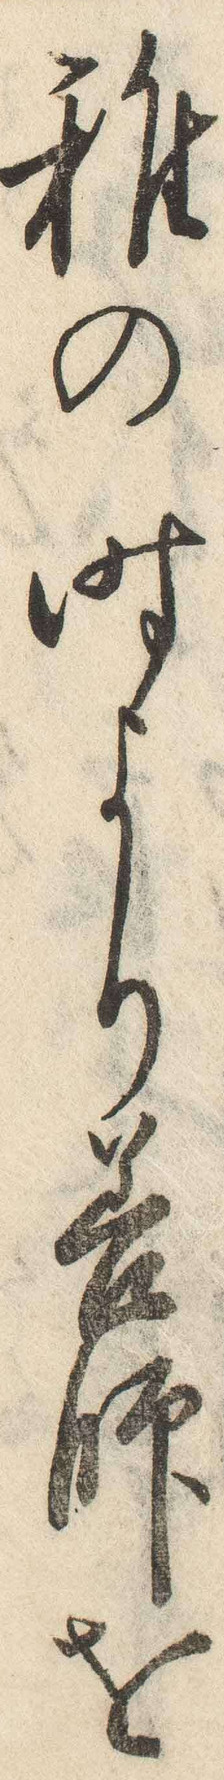稚の時より善師を
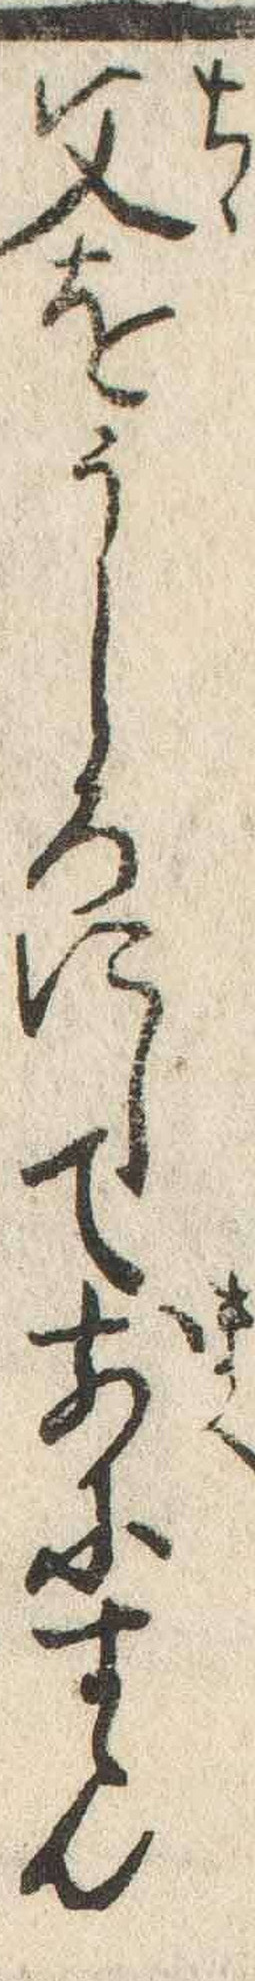父をうしろにして前にすゝん
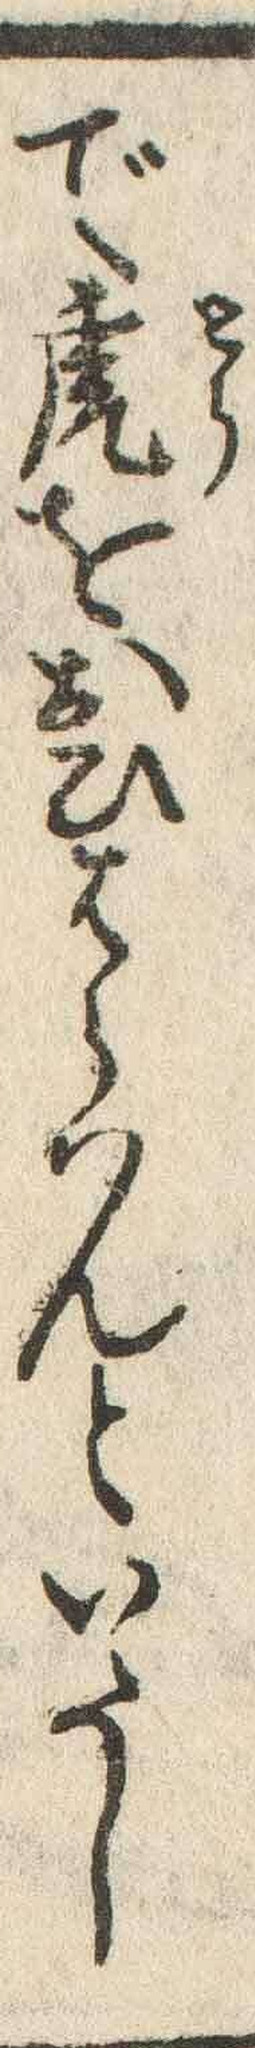で虎をおひはらはんといたし
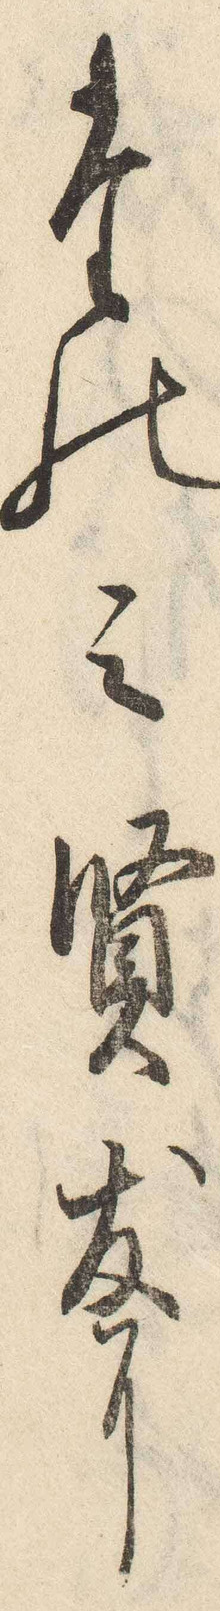たのみ賢友に
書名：撫育草
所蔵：東京学芸大学附属図書館 国文学研究資料館
